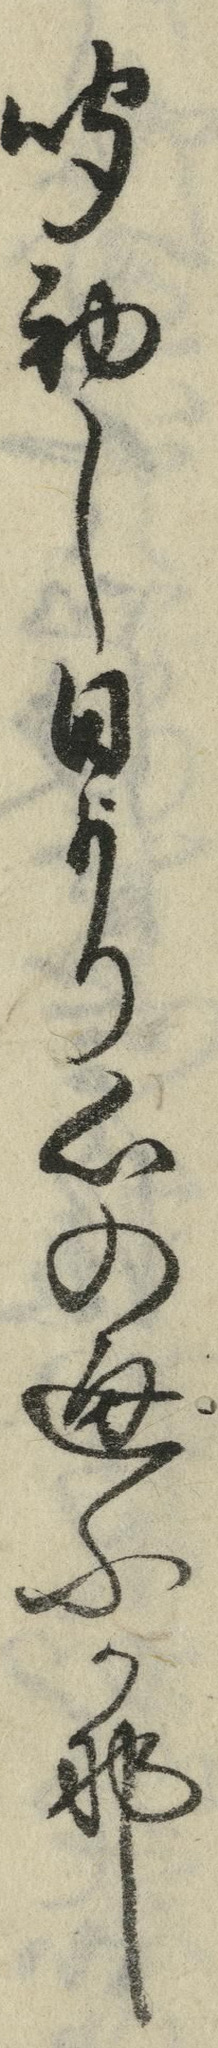聞初し日より心の通ふかな
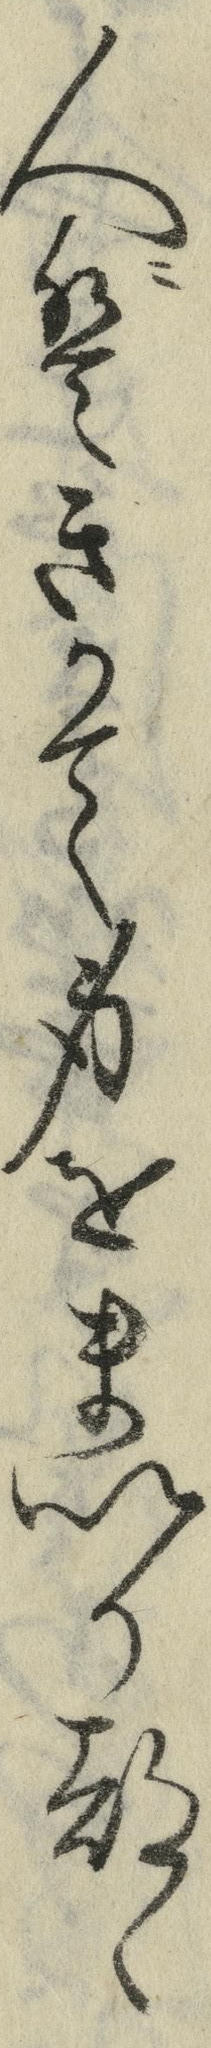人ニはきかて身をまいりつゝ
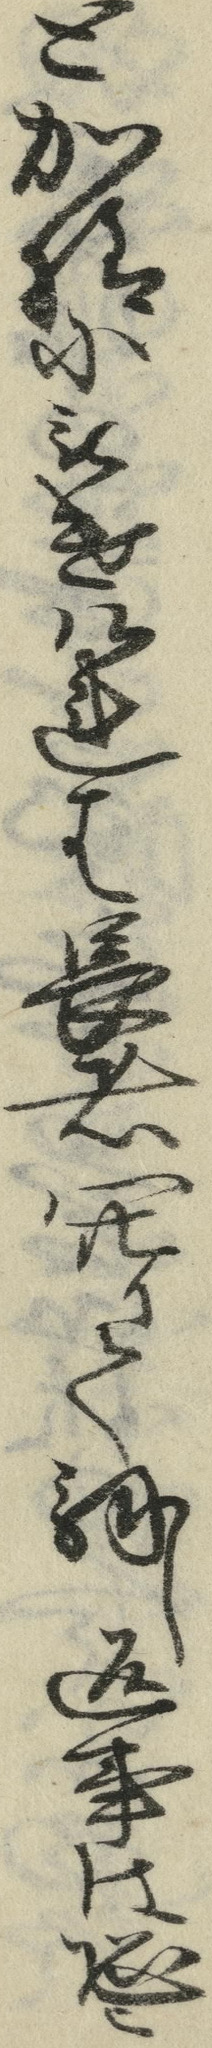とか様に被遣けれは長者開りて拝し返事は恐〻
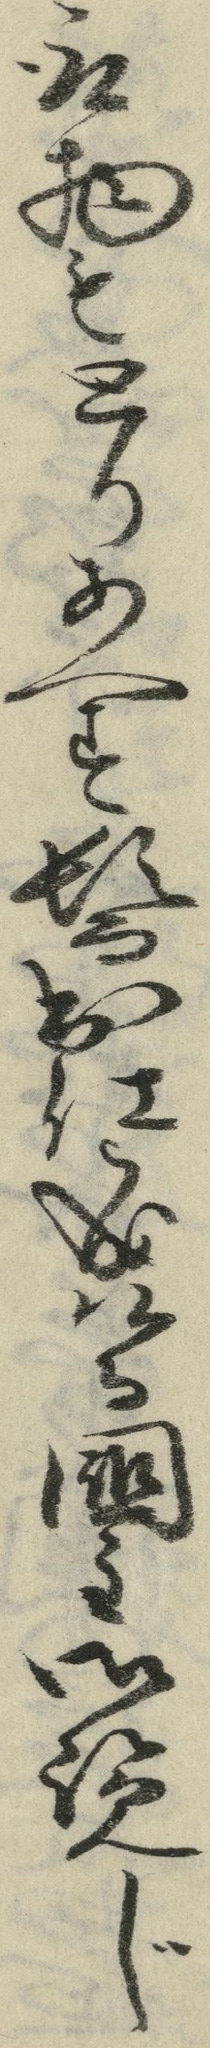取物もとりあへす頓而出仕被成ける国主御覧じ
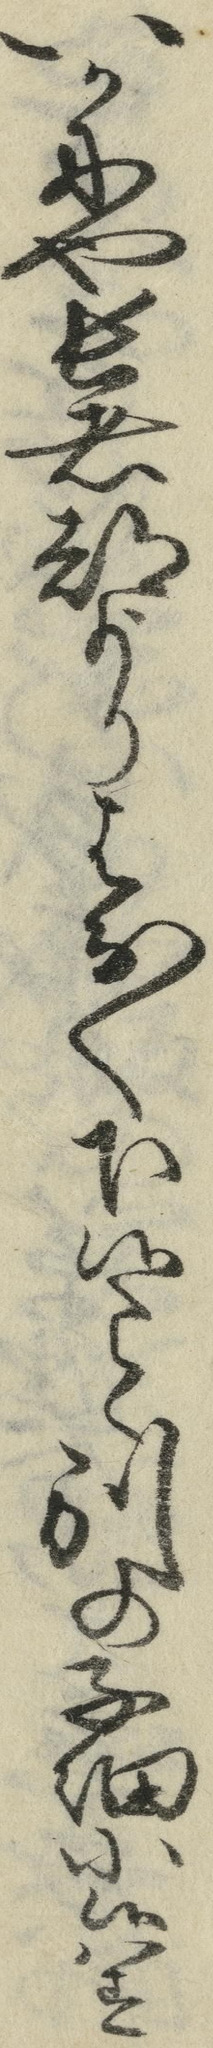いかにや長者都よりはる〳〵下候こと別の子細に候はす
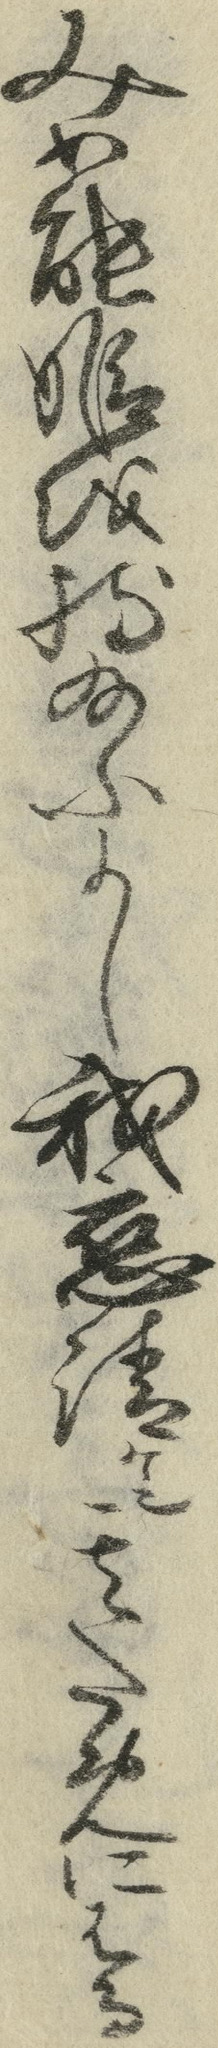みめ能姫を持給ふよし我恋請ケン其ためにはる
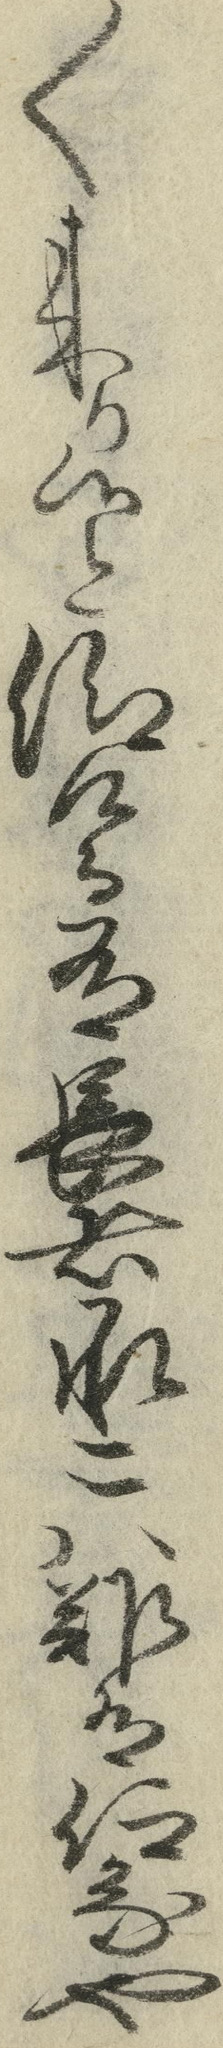〳〵来り候と仰ける有長者承ニハ難有仰かなや
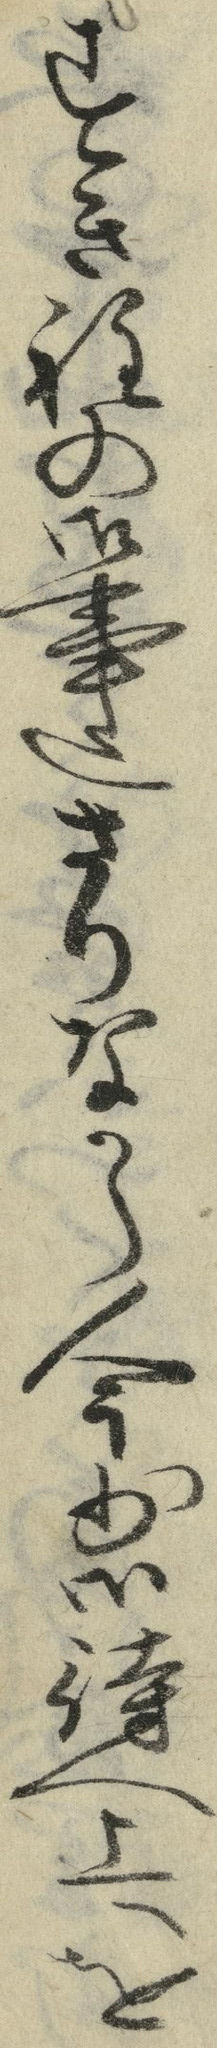すき程の御事也さりなから今少御待人上へを
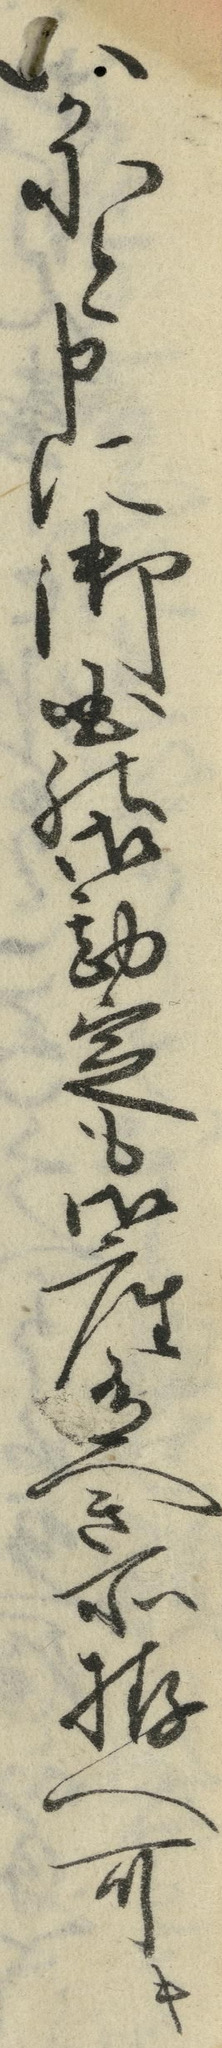いかにと申に御国の御勘定も御座有へき所拵へ可キ
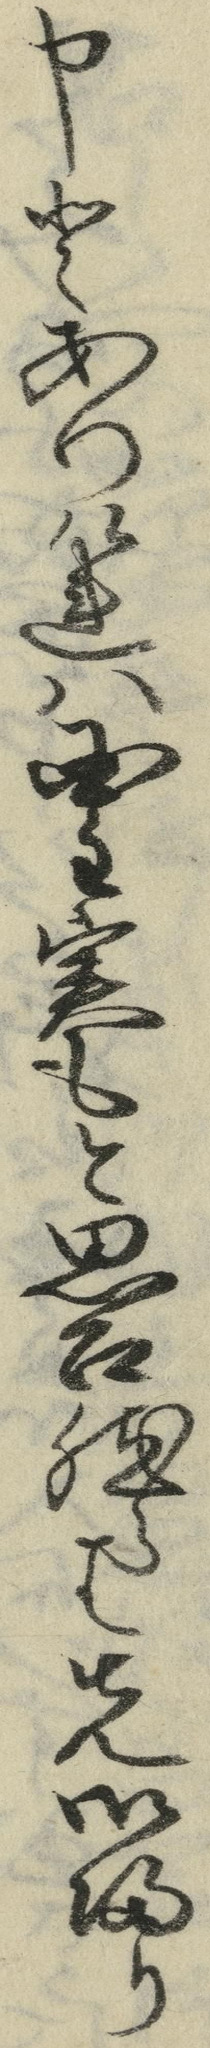申とありけれは国主実もと思召然らは先御帰り
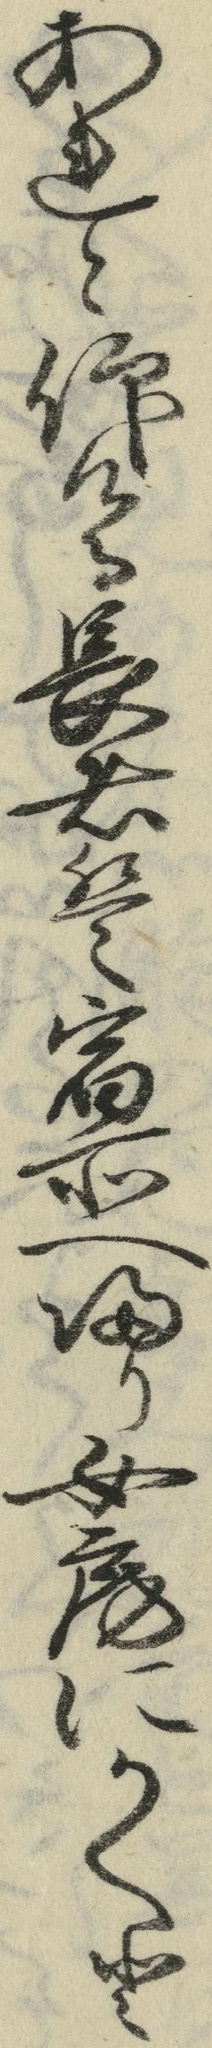あれと仰ける長者は宿所へ帰り女房にかくと
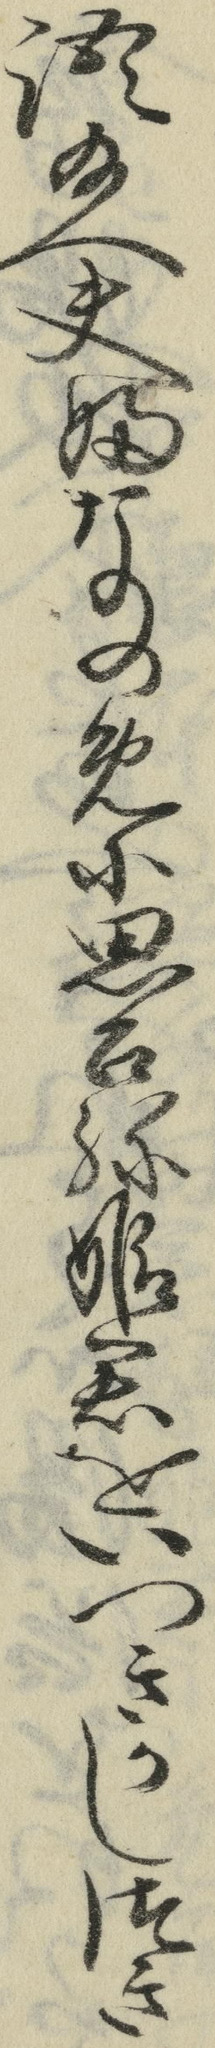語給へ夫婦なのめに思召弥姫君をいつきかしつき
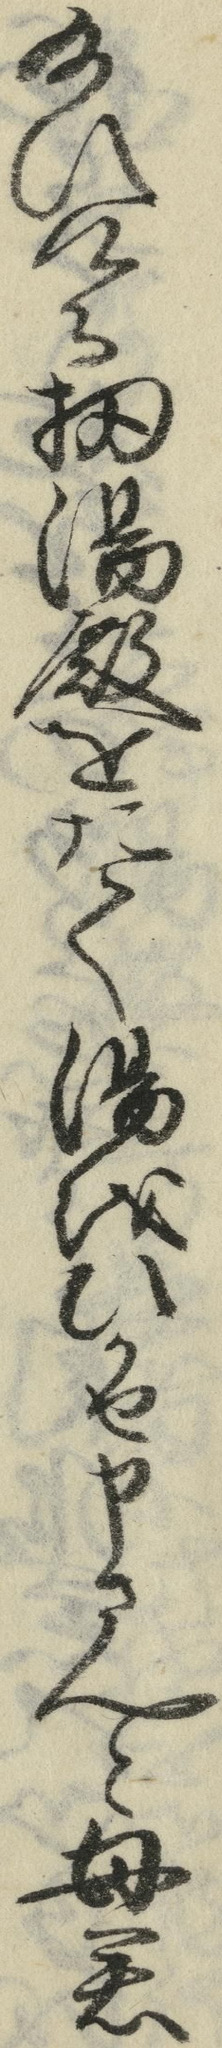給ひける扨湯殿をたて湯をひかせ申さんと母君
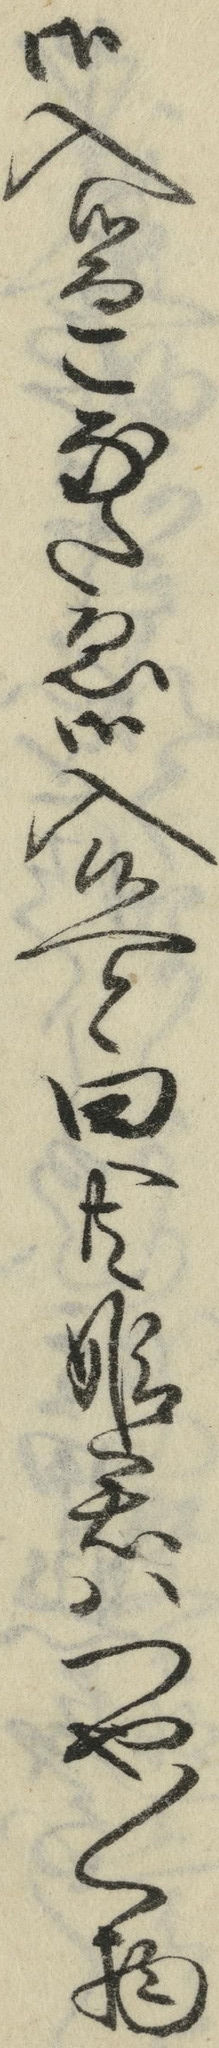御入候而こなたゑ御入候へと曰へ共姫君はつや〳〵物
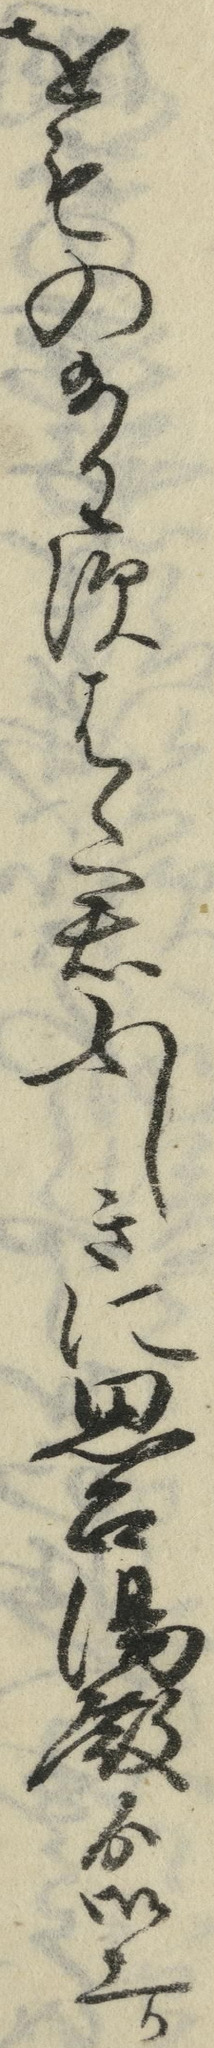をもの給わすはゝ君ふしきに思召湯殿ゟ御上り
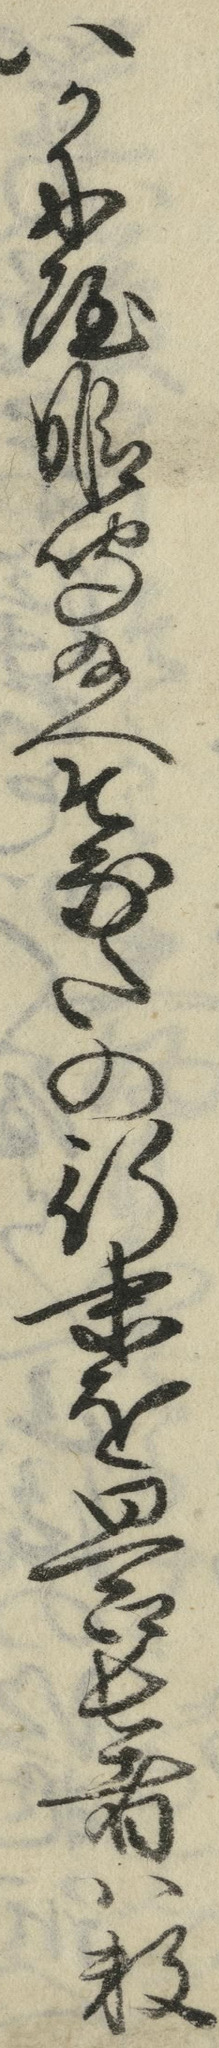いかにや姫聞給へそなたの行末を思召長者は数
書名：浅間記
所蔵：東京大学地震研究所図書室 Earthquake Research Institute Library, The University of Tokyo, JAPAN
